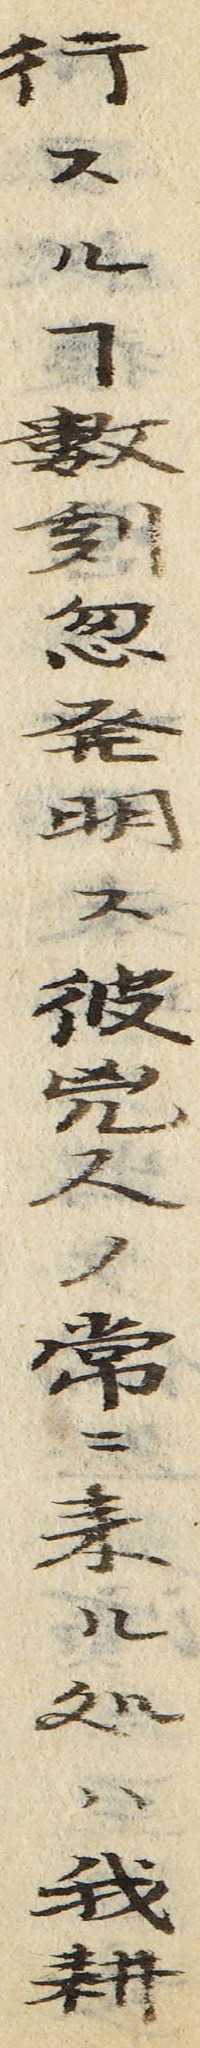行スルコト数刻忽発明ス彼兇人ノ常ニ来ル処ハ我耕
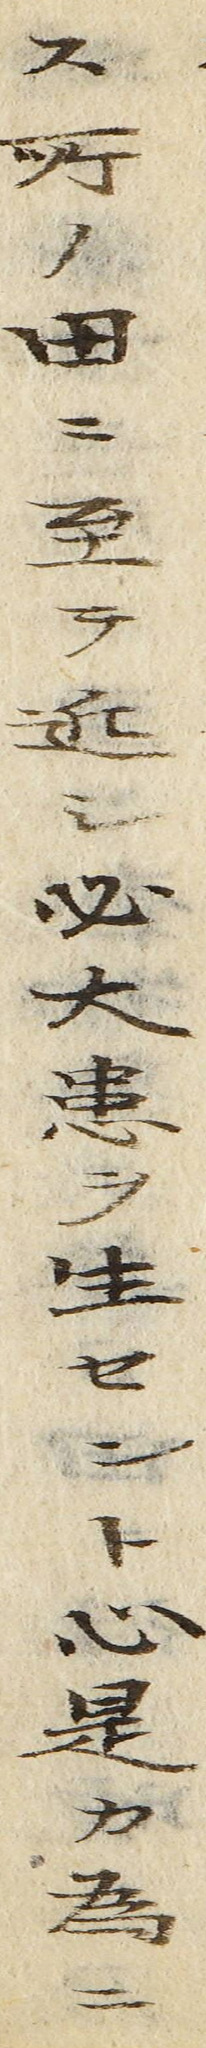ス所ノ田ニ至テ近シ必大患ヲ生セント心是カ為ニ
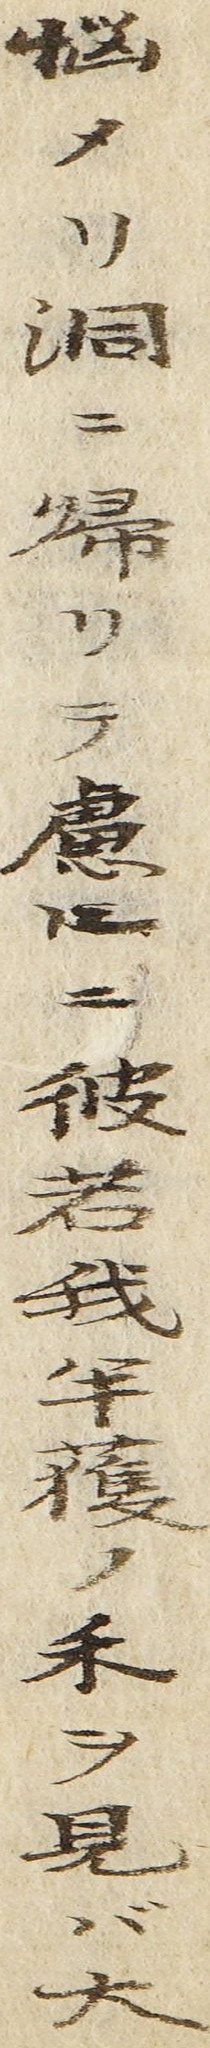悩メリ洞ニ帰リテ慮ルニ彼若我半獲ノ禾ヲ見バ大
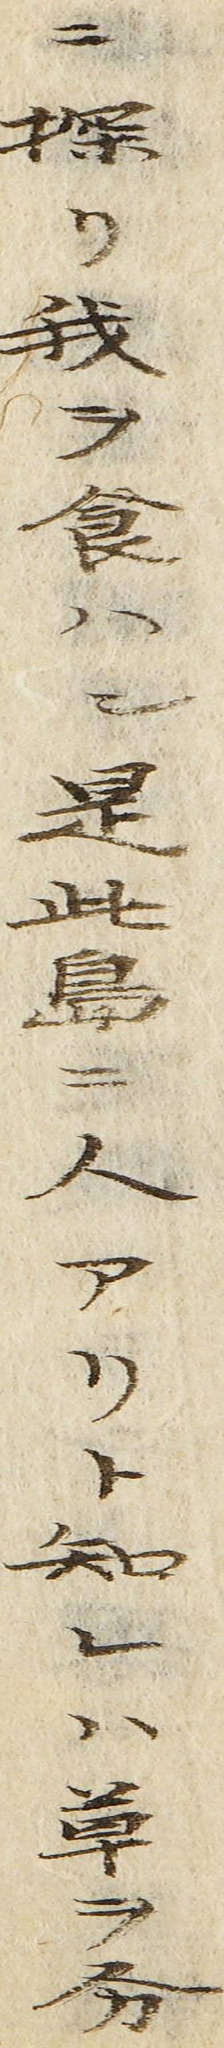ニ探リ我ヲ食ハン是此島ニ人アリト知レハ草ヲ分
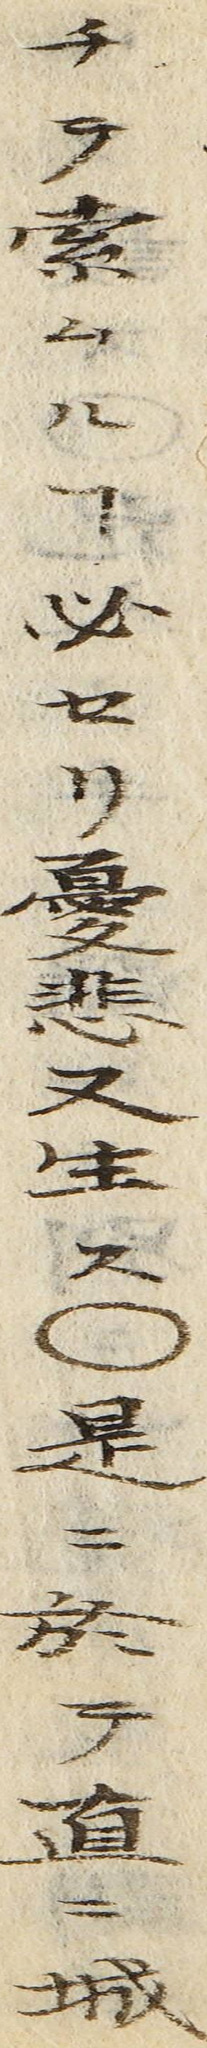チテ索ムルコト必セリ憂悲又生ス◯是ニ於テ直ニ城
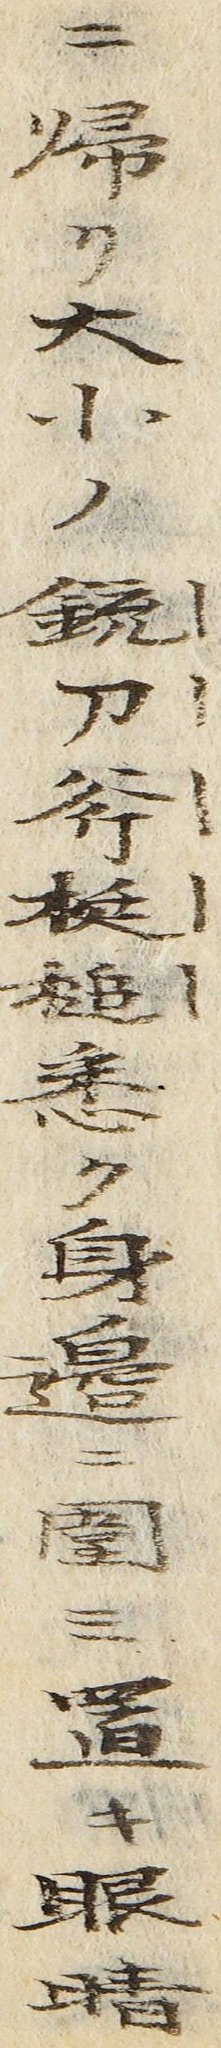ニ帰大小ノ銃刀斧梃槌悉ク身辺ニ囲ミ置キ眼晴
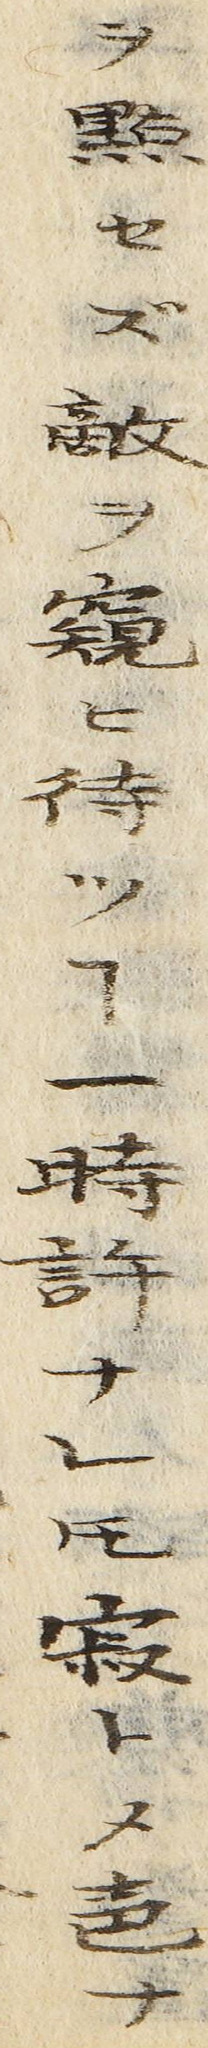ヲ点セズ敵ヲ窺ヒ待ツコト一時許ナレトモ寂トシテ声ナ
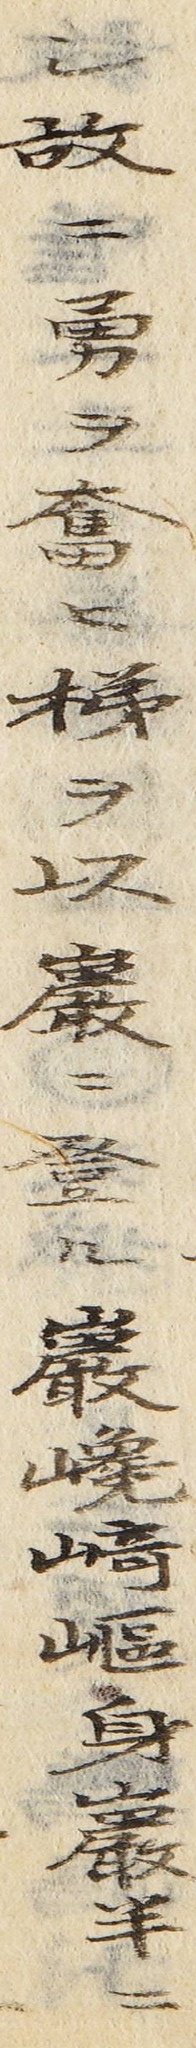シ故ニ勇ヲ奮ヒ梯ヲ以巌ニ登ル巌巉崎嶇身巌半ニ
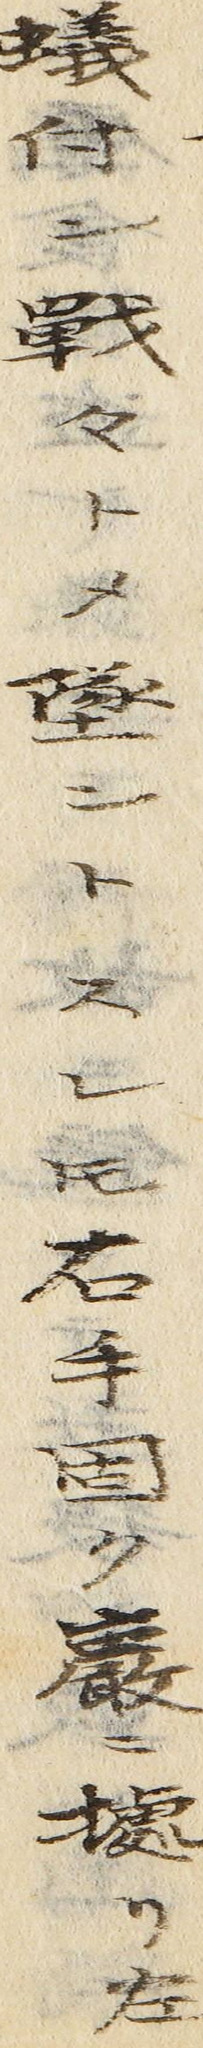蟻付ン戦々トシテ墜ントスレトモ右手固ク巌ニ拠リ左
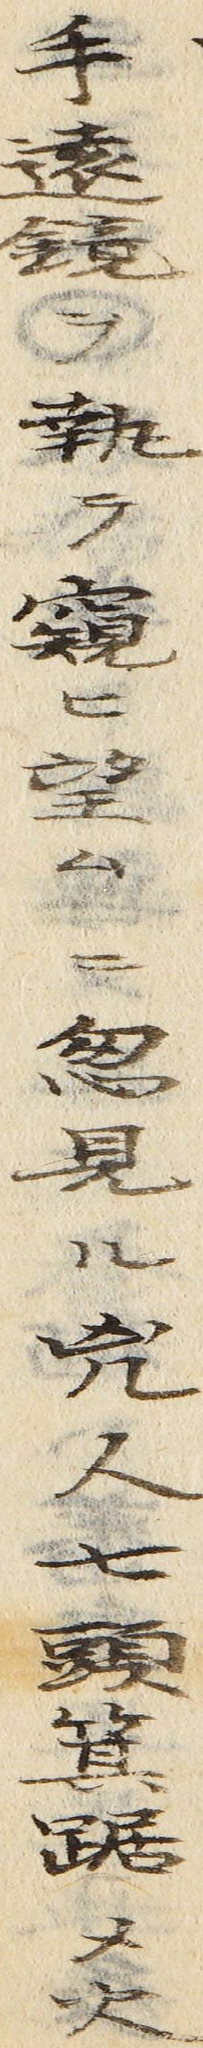手遠鏡ヲ執テ窺ヒ望ムニ忽見ル兇人七頭箕踞シテ火
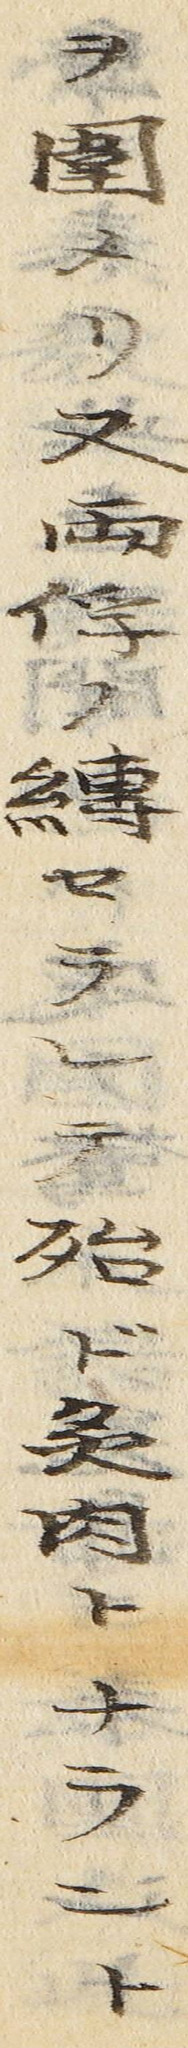ヲ囲メリ又両俘ノ縛セラレテ殆ド炙肉トナラント
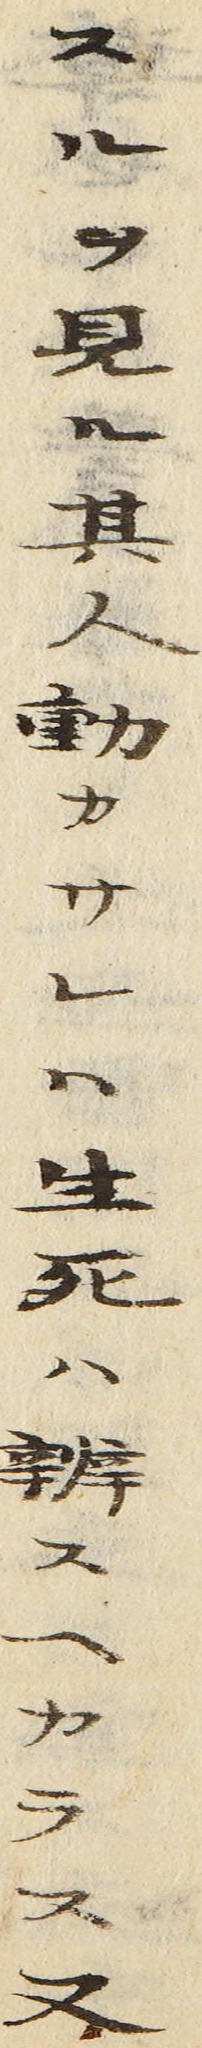スルヲ見ル其人動カサレハ生死ハ弁スヘカラス又
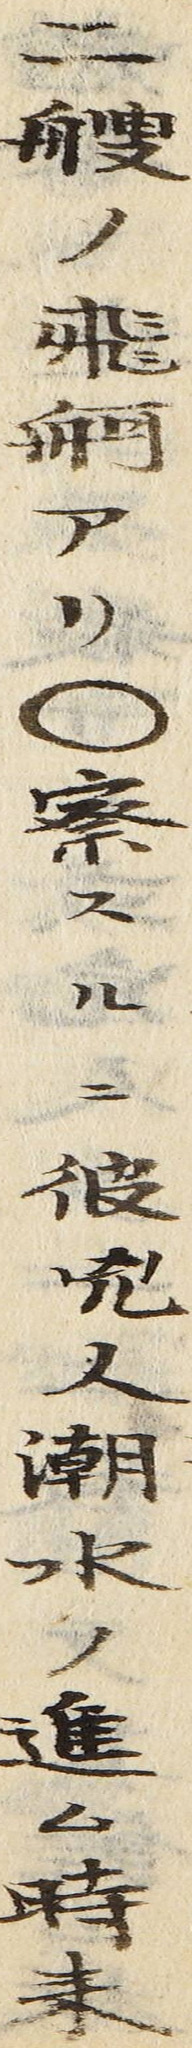二艘ノ飛舸アリ◯察スルニ彼兇人潮水ノ進ム時来
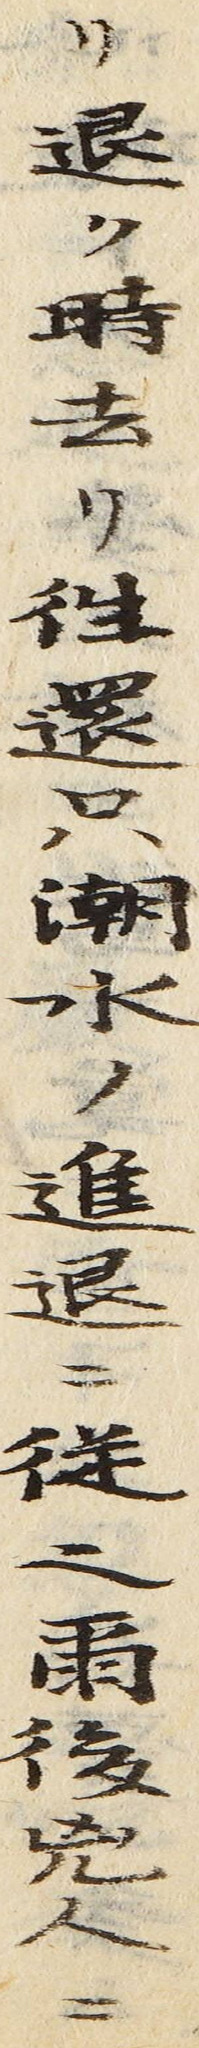リ退ク時去リ往還只潮水ノ進退ニ従也爾後兇人ニ
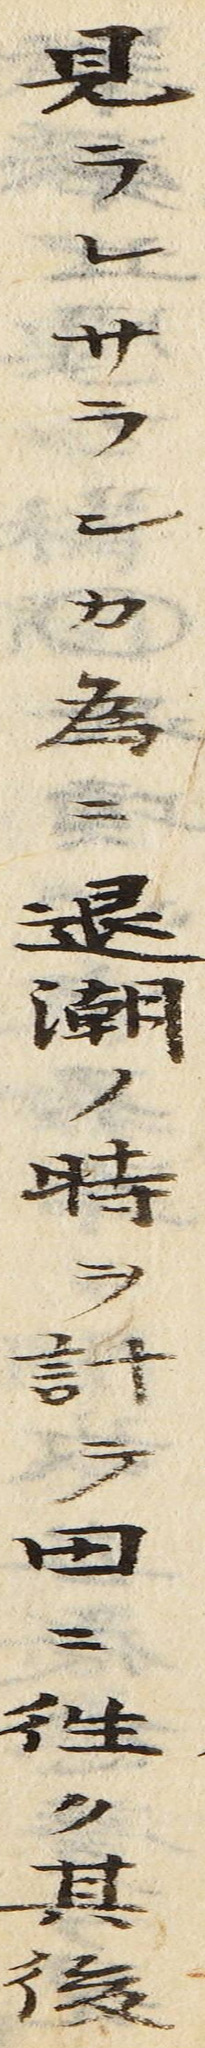見ラレサランカ為ニ退潮ノ時ヲ計テ田ニ往ク其後
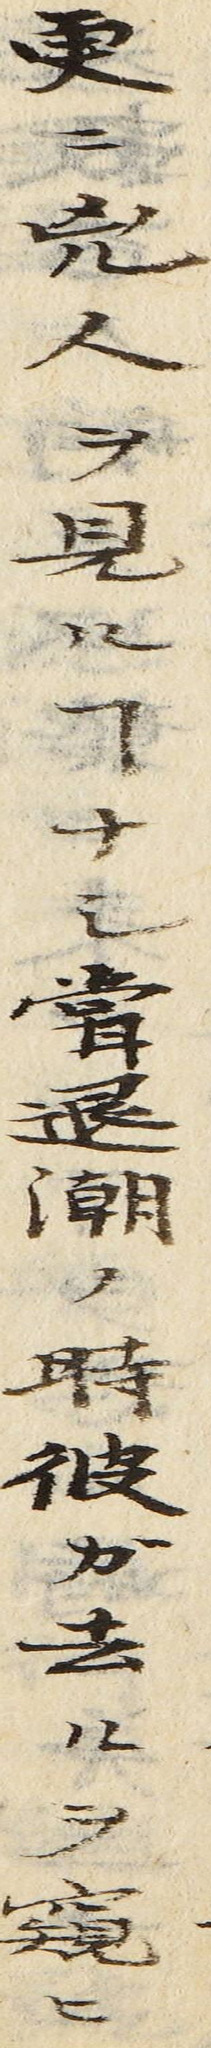更ニ兇人ヲ見ルコトナシ嘗退潮ノ時彼ガ去ルヲ窺ヒ
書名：漂流紀事
